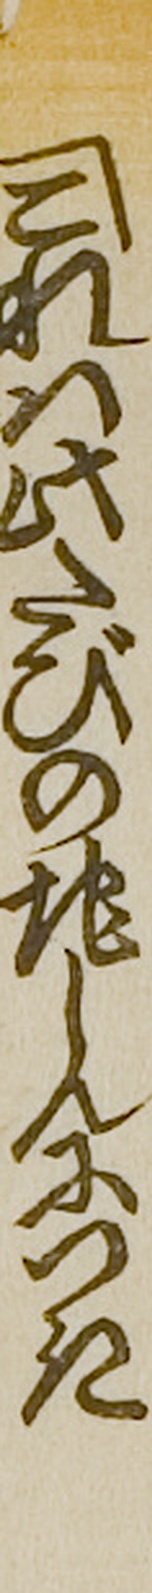「これは此たびの地しんにつき
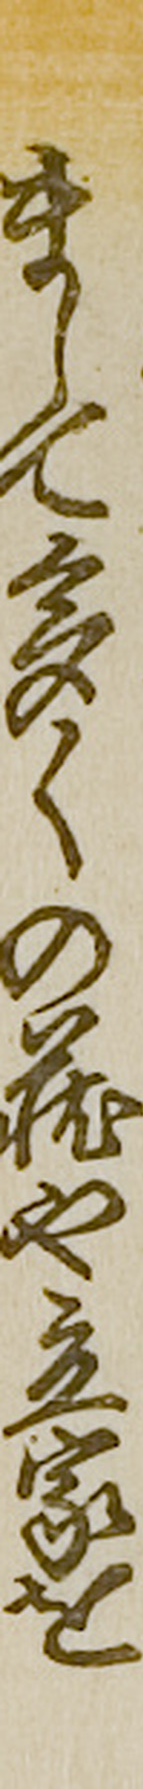まして多くの蔵や立家を
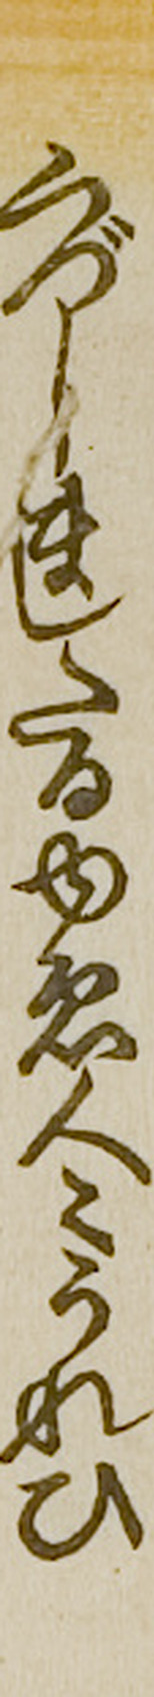くづしましたるゆゑ人々うれひ
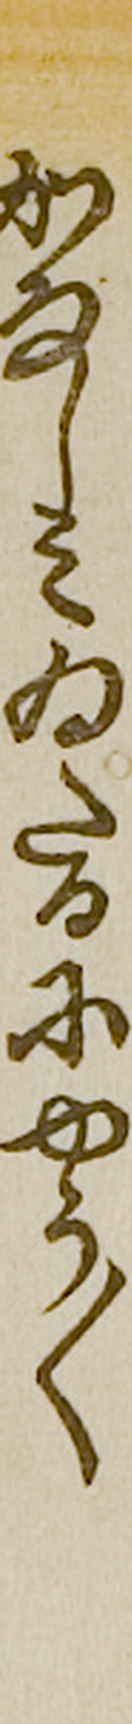かなしみゐたるにやう＼
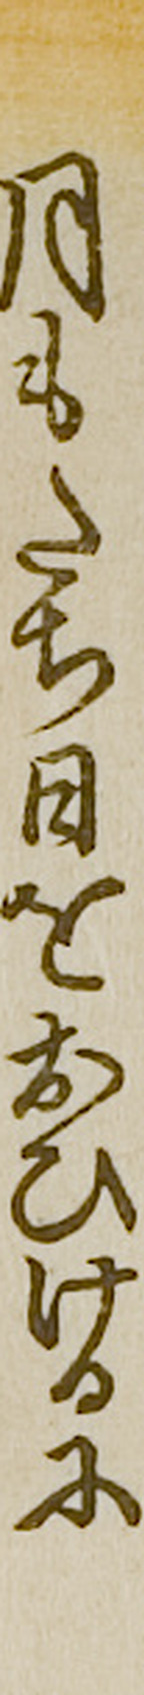月もたち日をおひけるに
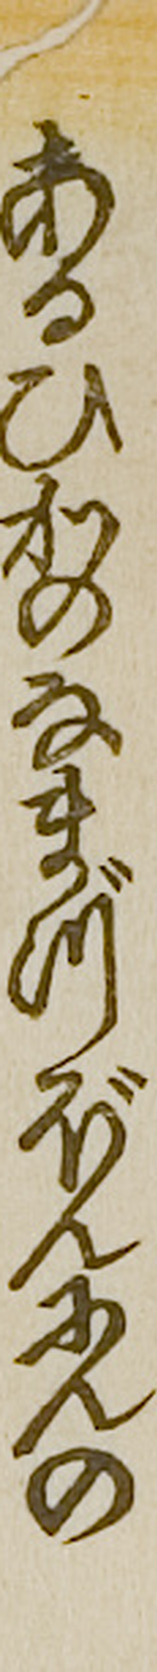あるひかのなまづぼんにんの
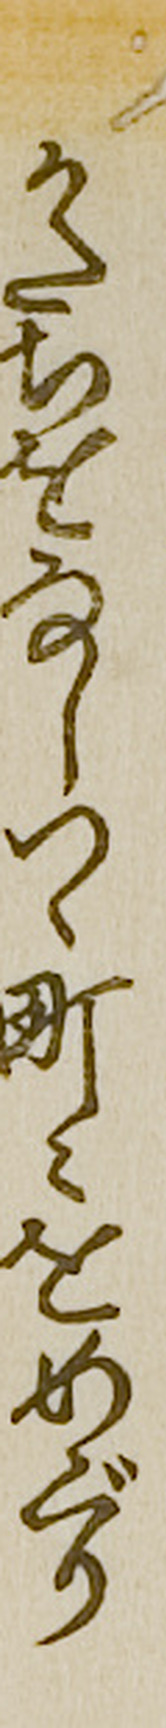かたちをなしつゝ町々をめぐり
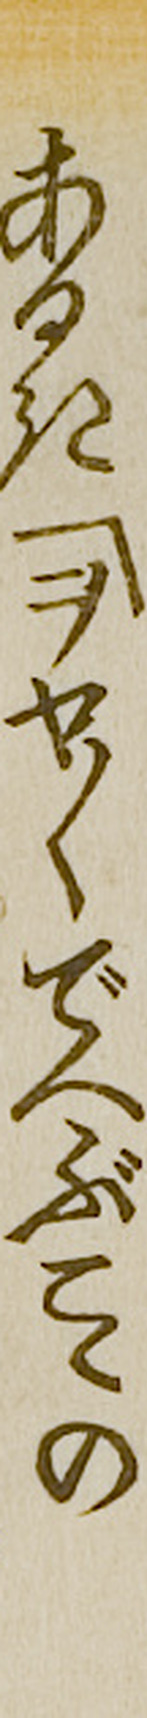あるき「ヲヤ＼でへぶこゝの
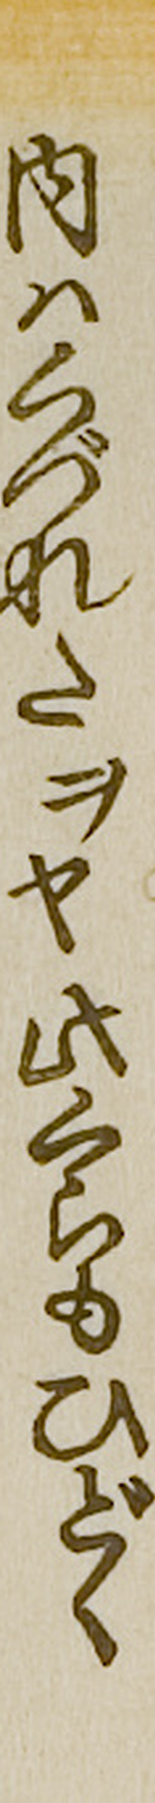内はくづれたヲヤ此くらもひどく
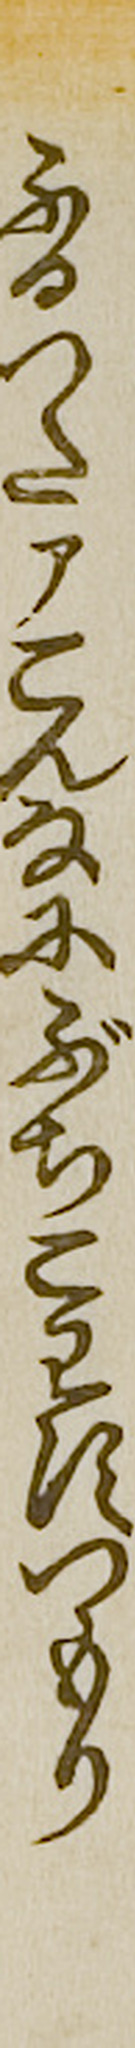ふるつたアこんなにぶちこわすつもり
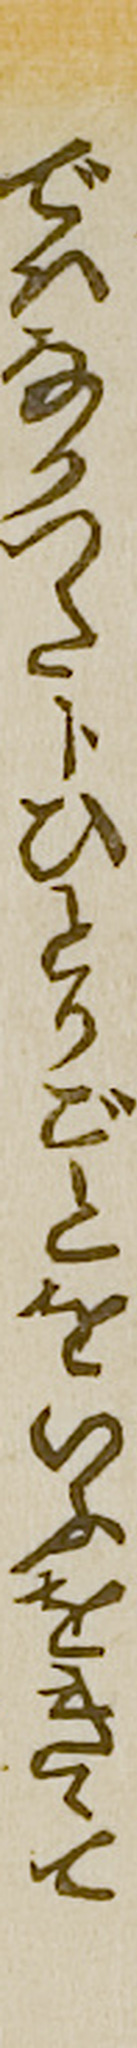ではなかつたトひとりごとをいふをきゝて
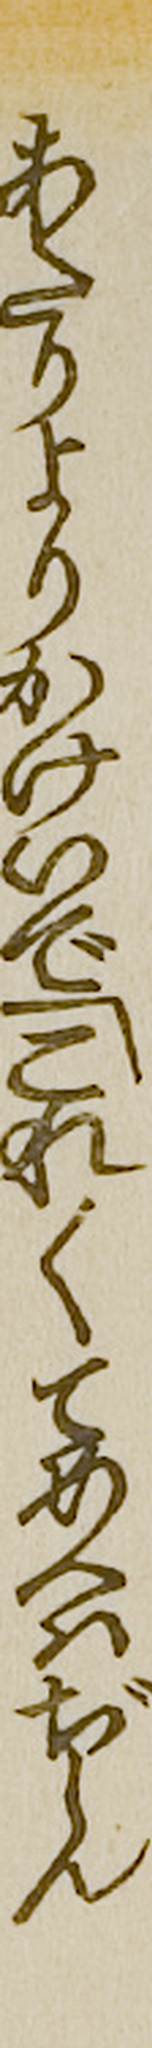あたりよりかけいで「これ＼てめへはぢしん
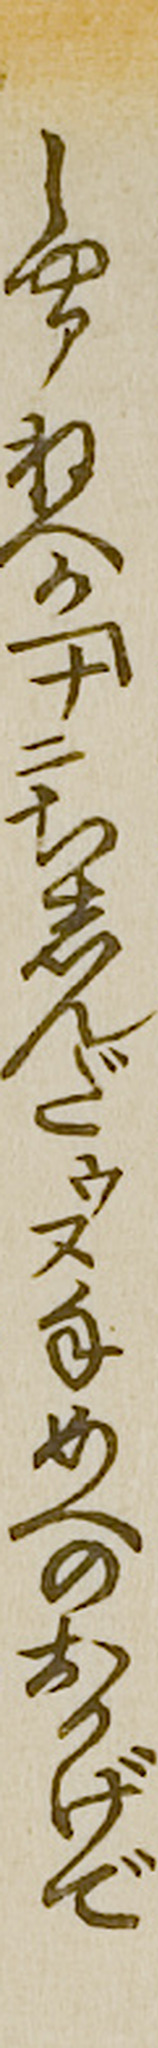しやアねへか「ナニちしんだウヌ手めへのおかげで
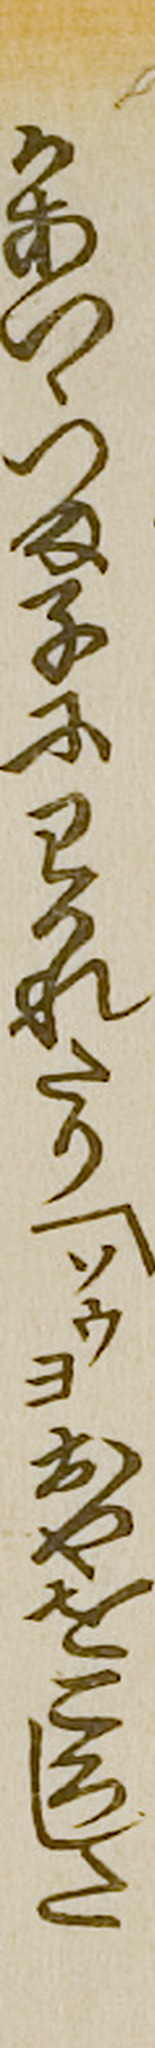かあいゝつま子にわかれたり「ソウヨおやをころした
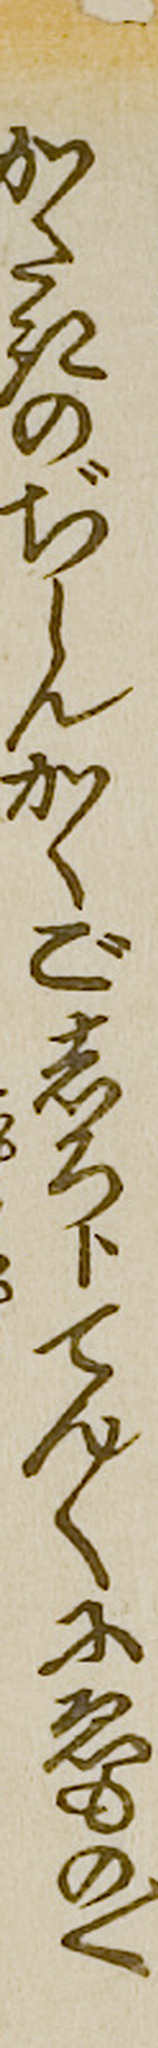かたきのぢしんかくごしろトてん＼にゑもの＼
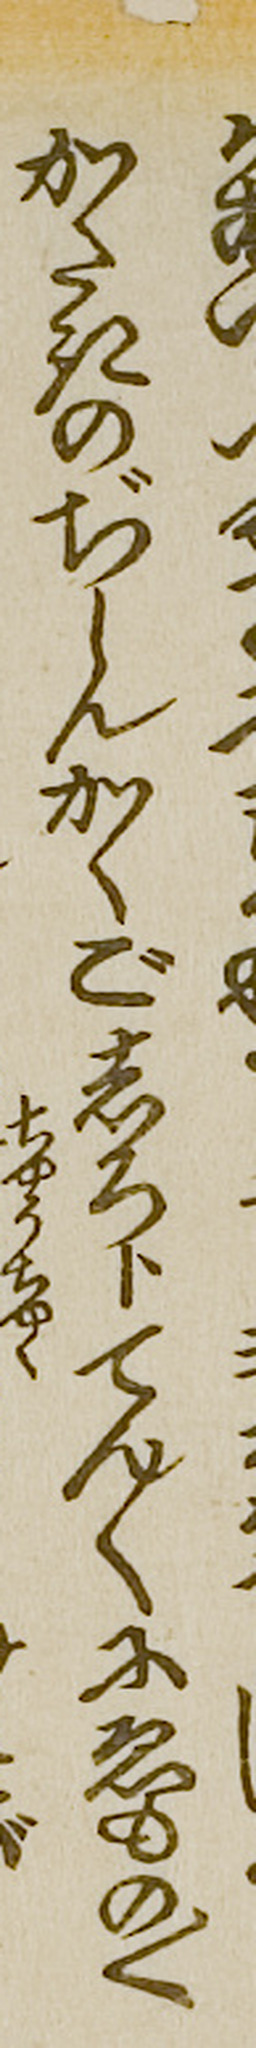かたきのぢしんかくごしろトてん＼にゑもの＼
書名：即席鯰はなし
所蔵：東京大学総合図書館 General Library in the University of Tokyo, JAPAN
